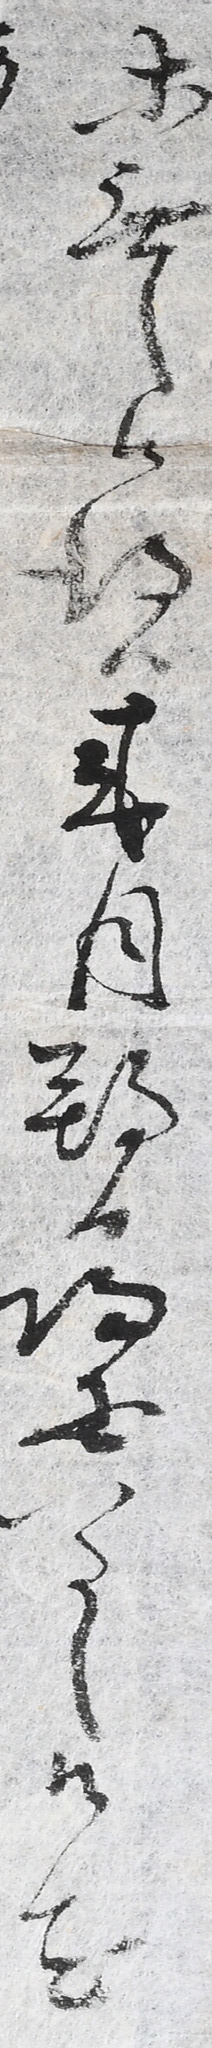等無之候得ハ来月朔日帰国いたし候尤
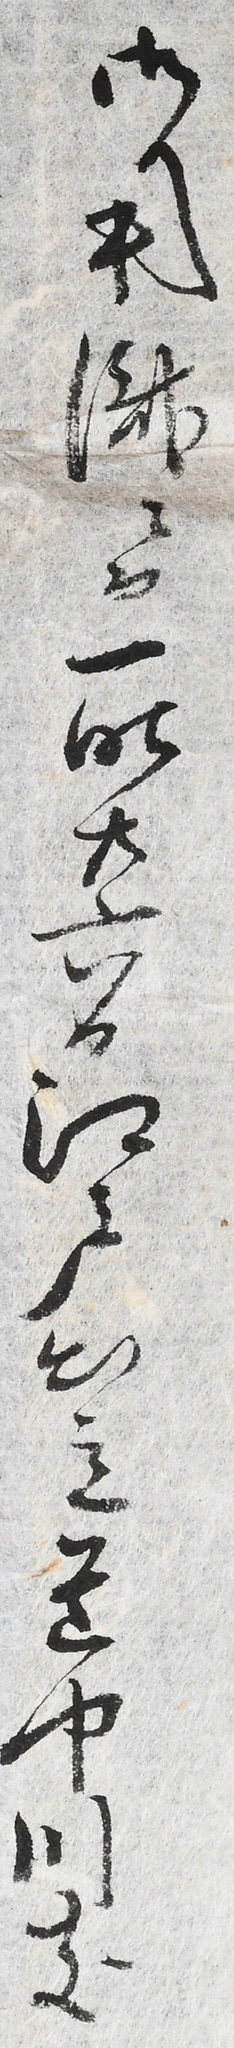御用済ニ而一昨廿六日江戸出立道中川支
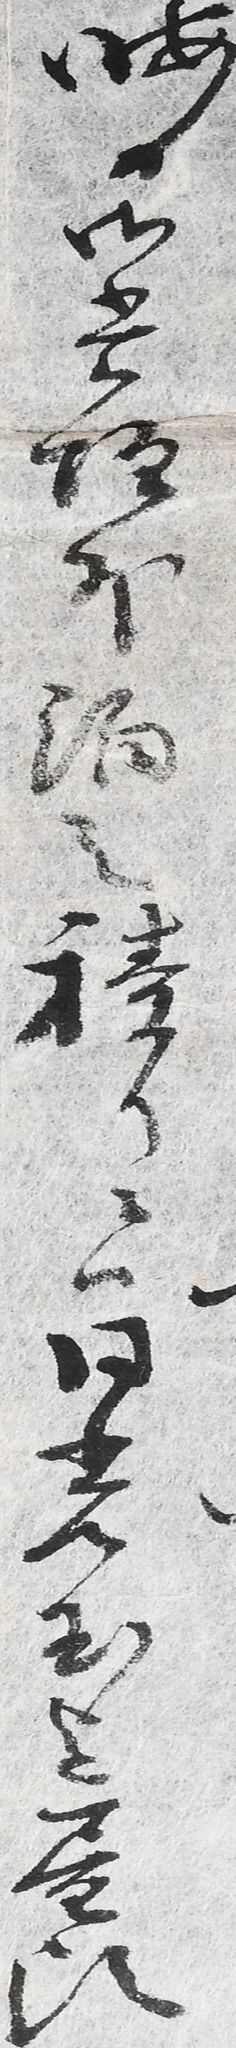晦日御当極外酒之積りニは同光屋迄昼頃
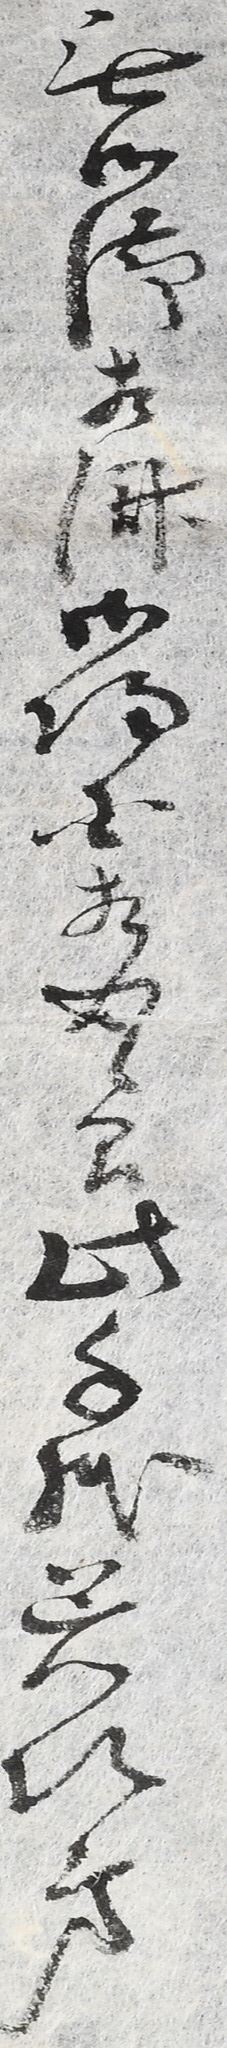無御滞相済御帰国相成間此手代着次第
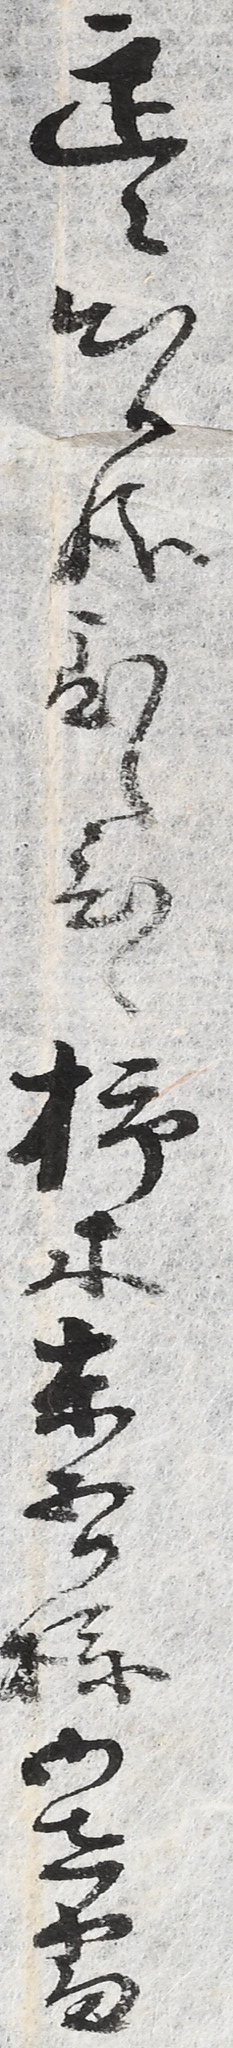遅々出候様ひしひゝ柿木東五日様御世番
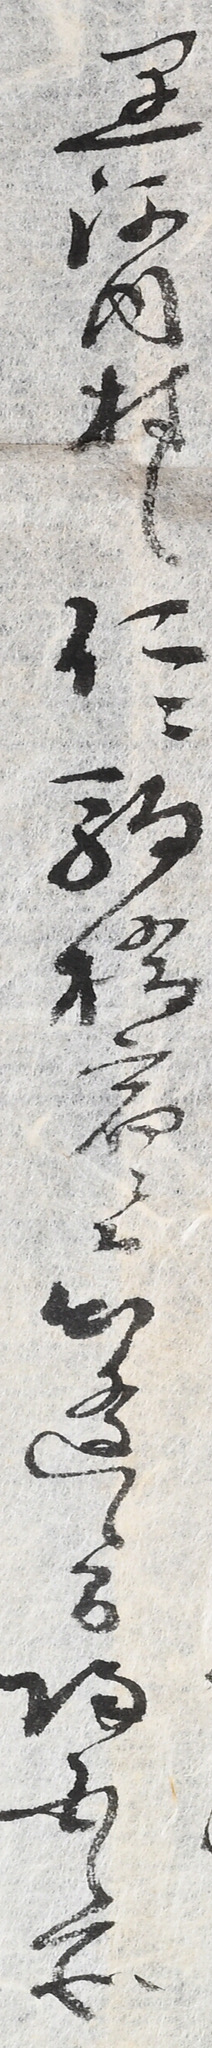黒河内村々仁ニ駒橋宿ニ而出逢候間帰国之所
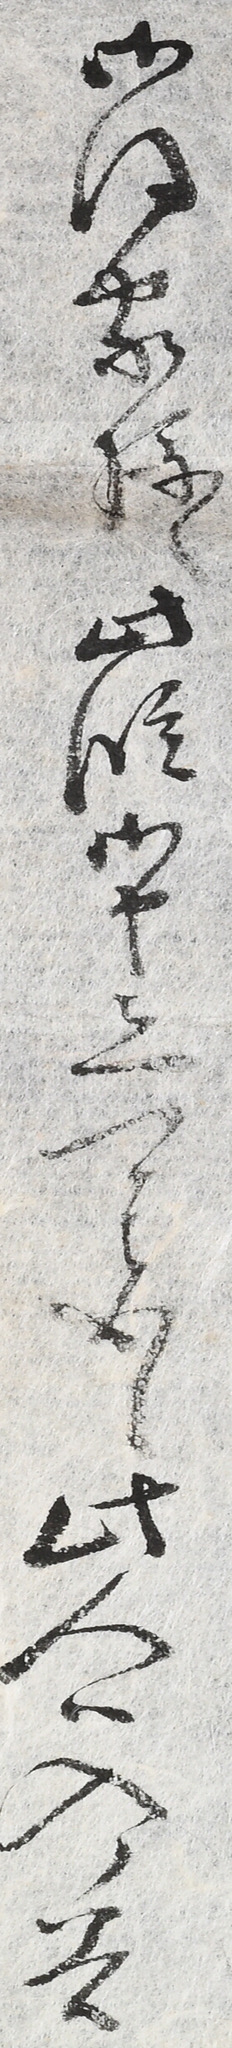御同家様へ此段御申上可被成候此人ハ入ノ谷
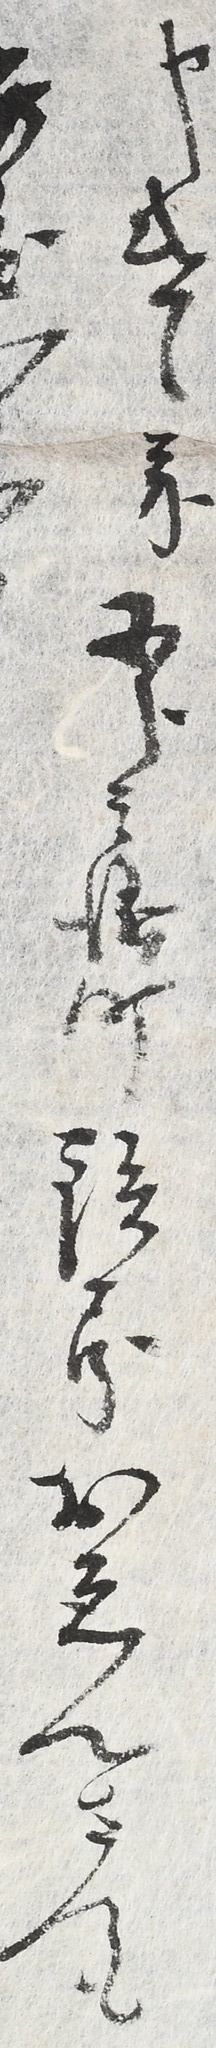申遣候所五郎兵衛町鉄蔵おゑんさんも
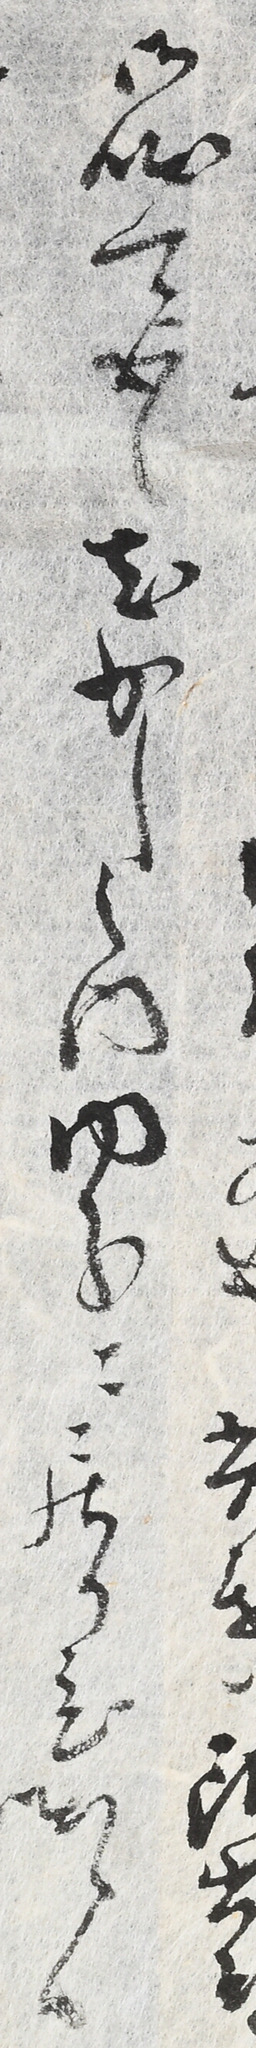御咄可出候尤少し之内ゆ屋ニ居り置出候以上
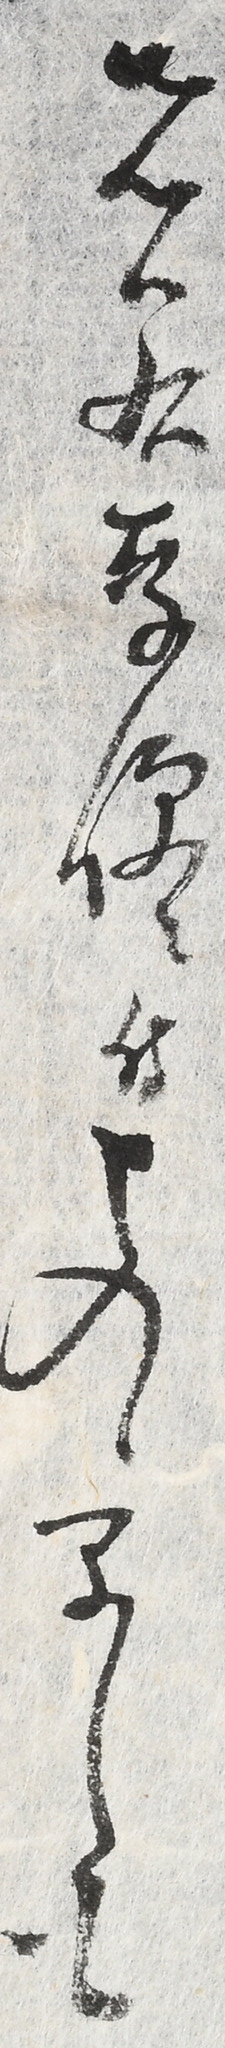先ハ右厚便ニ付申入候早々以上
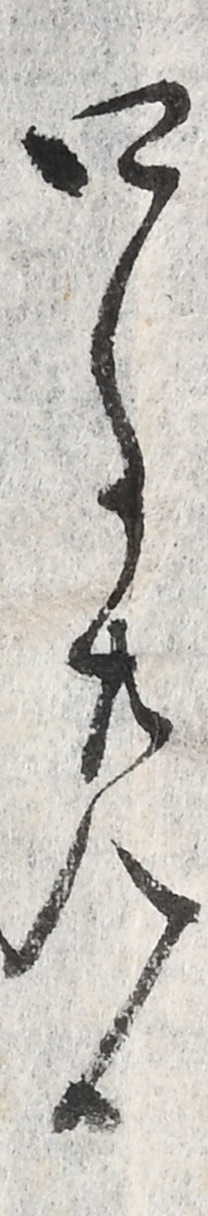四月廿八日

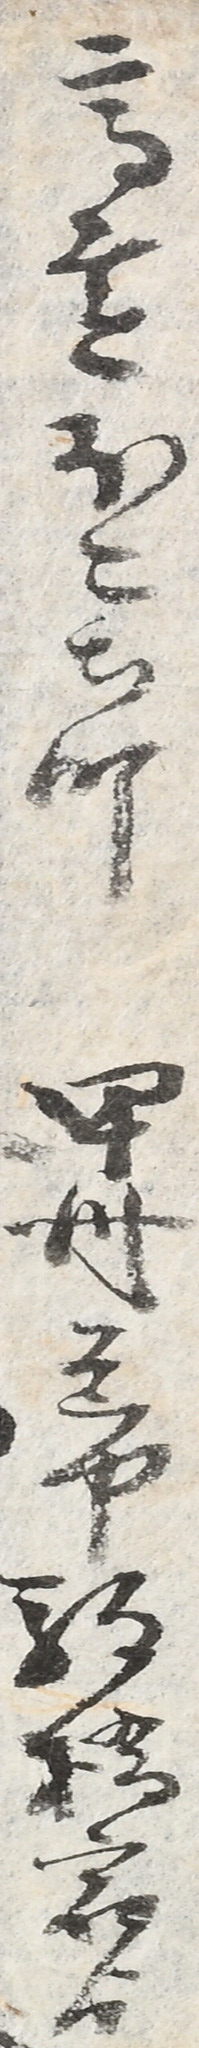高遠ほこち町甲州道中駒橋宿より
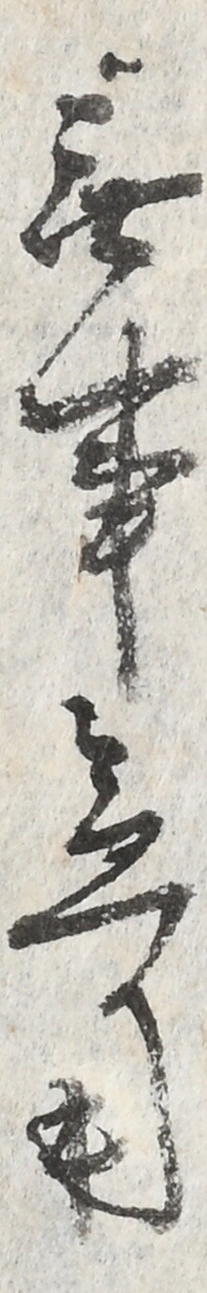無事無用
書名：（書状）
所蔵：伊那市立高遠町図書館・合同会社AMANE
